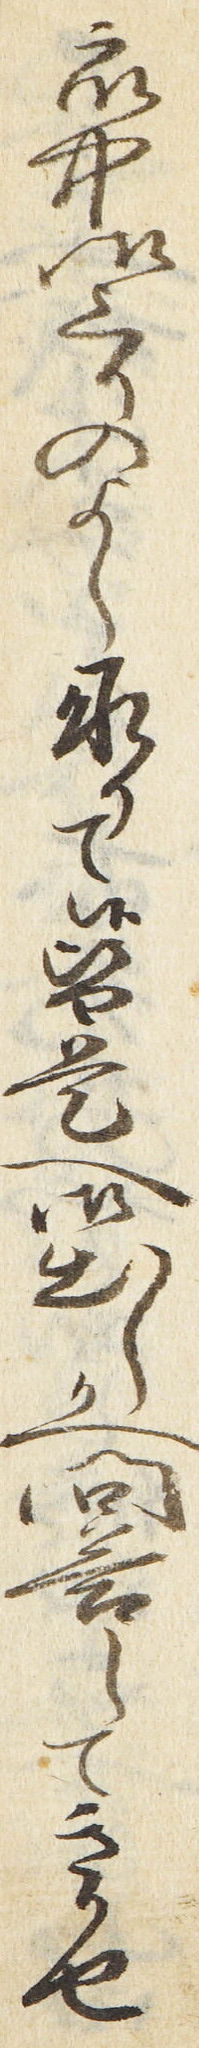衆中御上りのよし承りて候皆是へ御出し候へ問答してきかせ

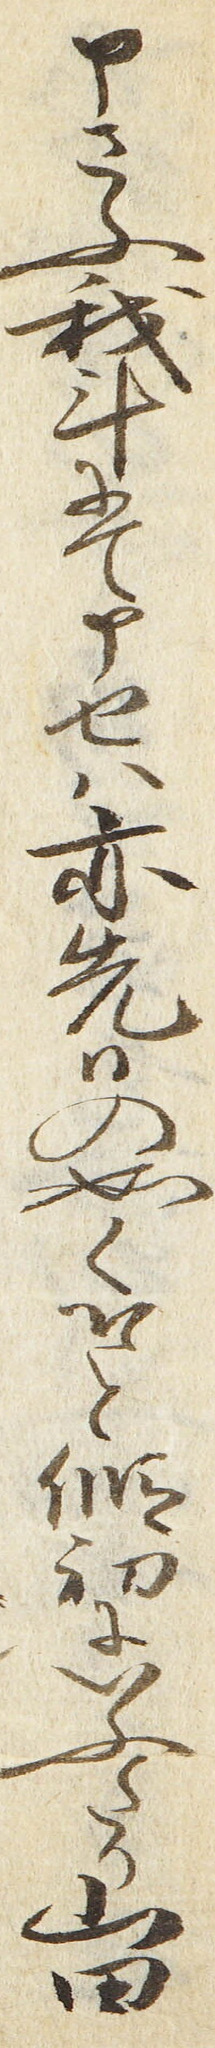申さふ我斗にて申せは亦先日の如くそと假初にいふたり山田
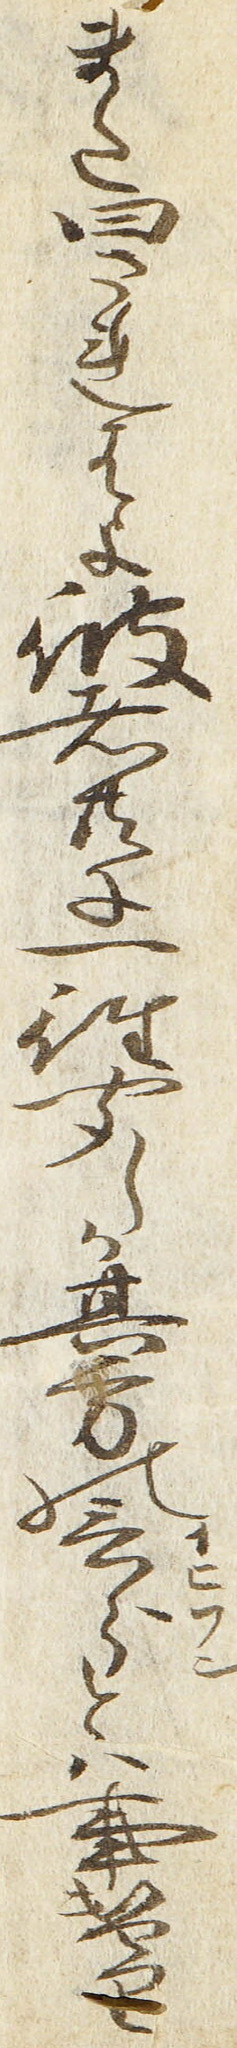また曰されはよ彼者共に一往聞しか其方の言分とは事替り
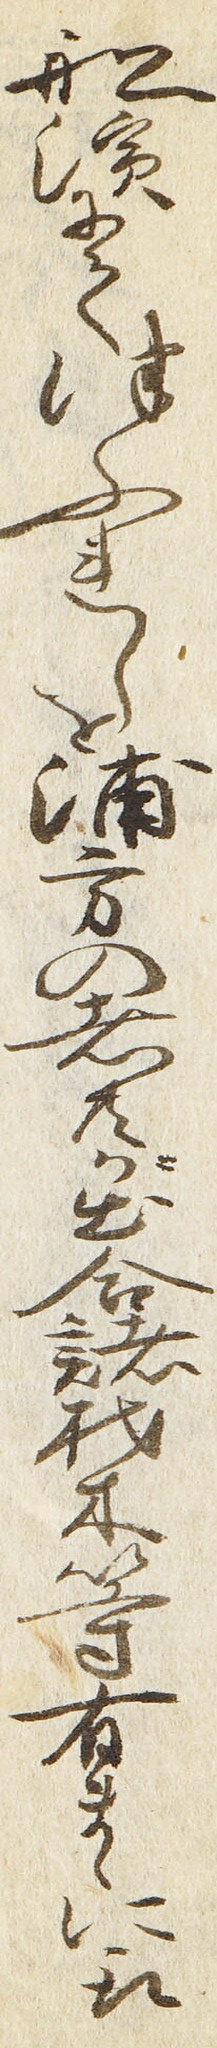船浜にてつふれしを浦方の者共が出合諸材木等有まゝに取
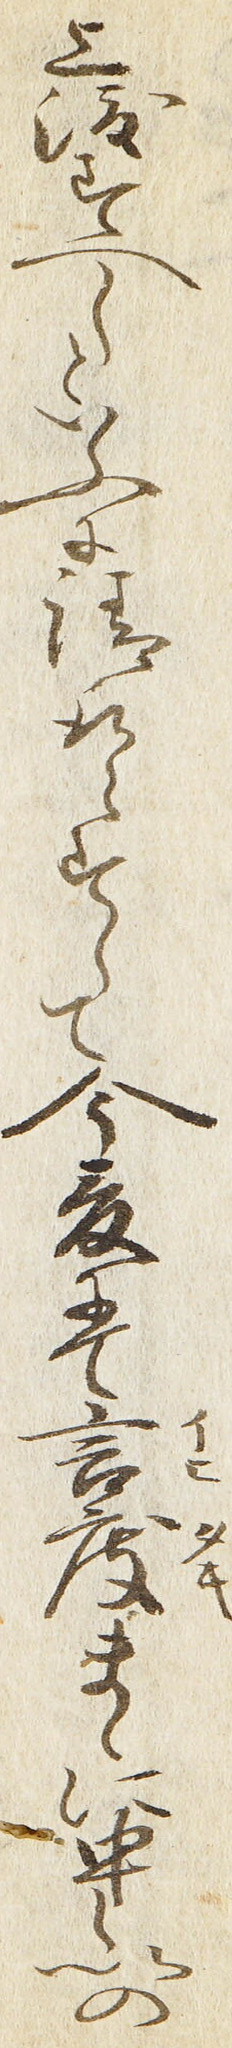上渡すへしといふに請取らすして今爰にて言度まゝに申し以の
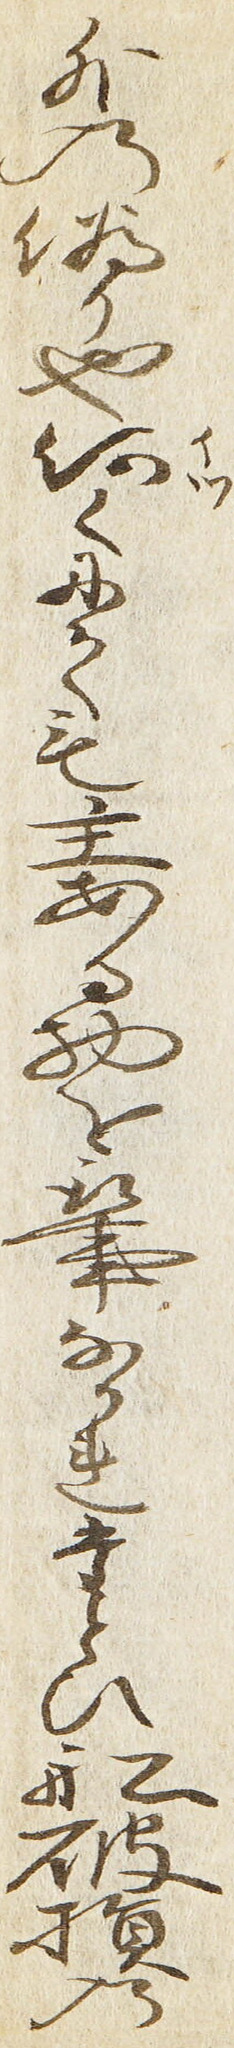外の偽りや何くにても主ある物を取事なかれたとひ船破損の
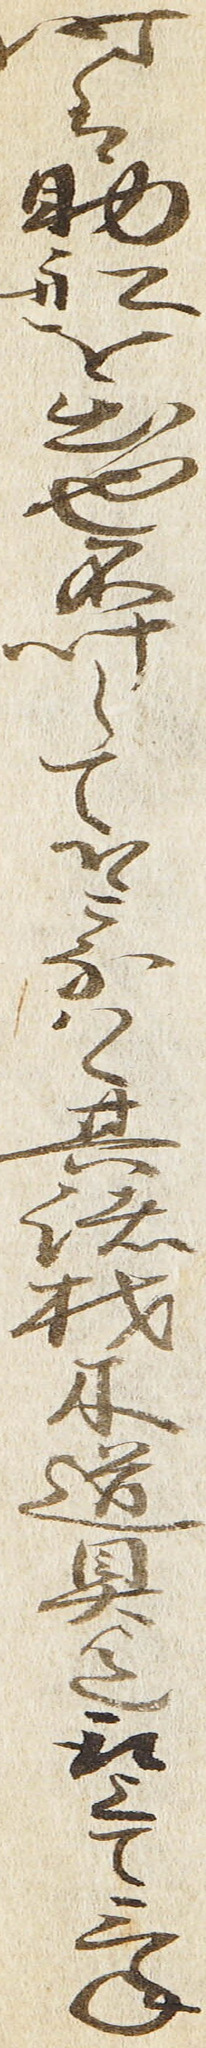時は助船を出也不叶してそこなはゝ其諸材木道具迄取上て三年
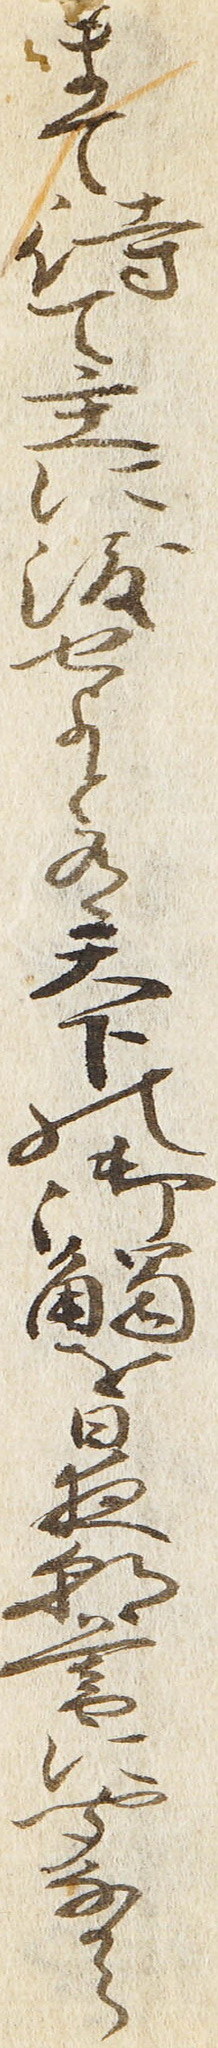まて待て主に渡せよと有天下の御触を日夜朝暮に聞なから
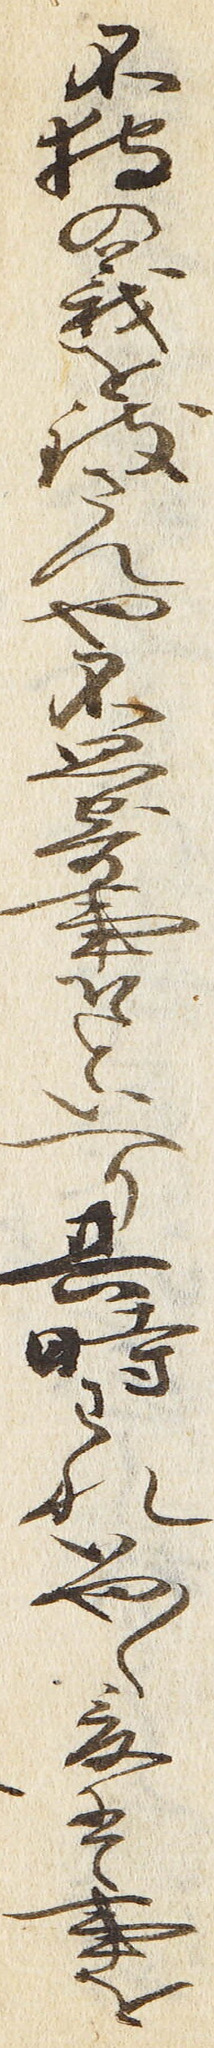不埒の義を致さんや不思寄事そといへり其時われいや〳〵爰にて事を
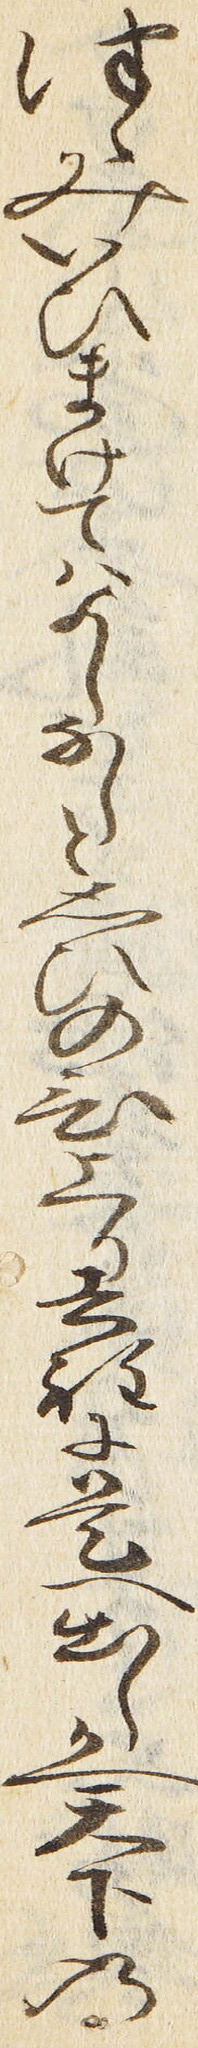つつみいひまけてはよしなしと思ひのひ上り去程に是へ出し候へ天下の
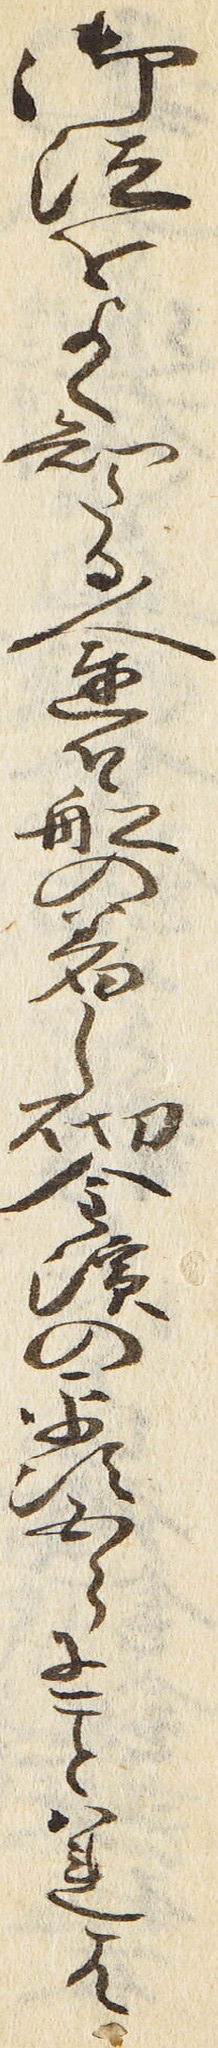御法をよく知たる人達そ船の着し砌金浜の平次五郎にことはれは
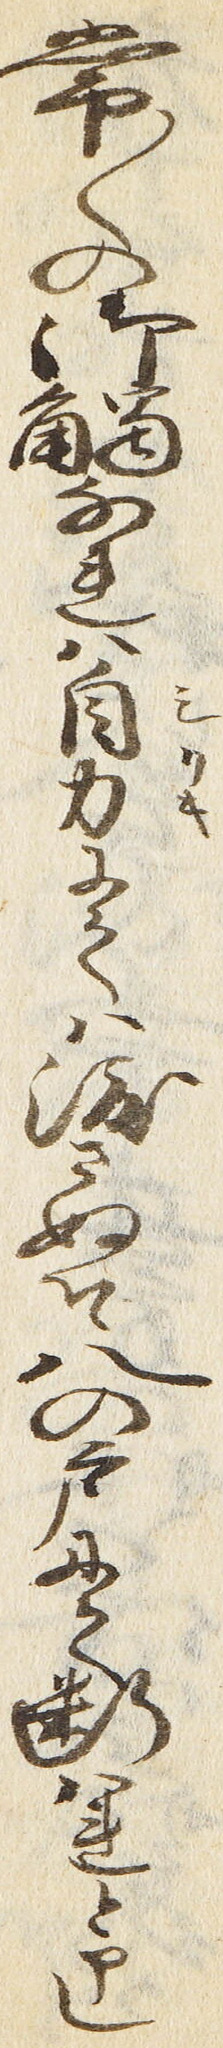常〳〵の御触なれは自力にては渡さぬそ八の戸にて断はれと申し
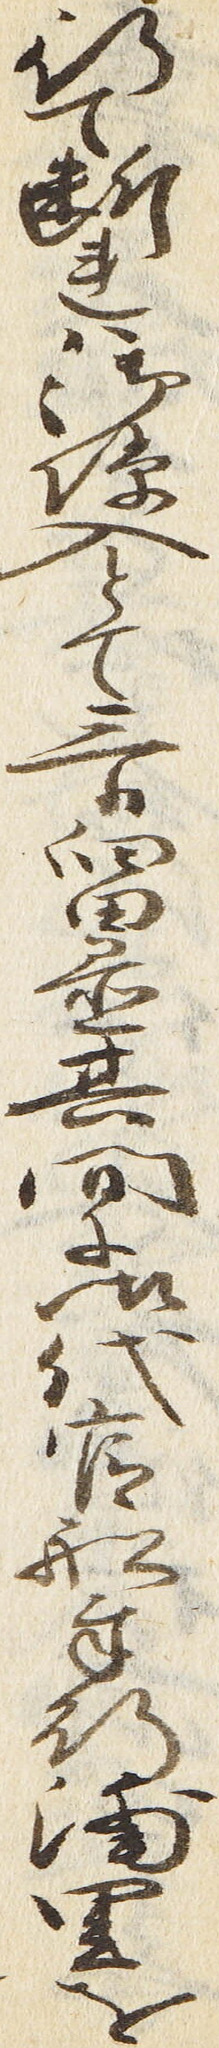行て断れは御障入とて三日留置其間に御代官船奉行浦里を
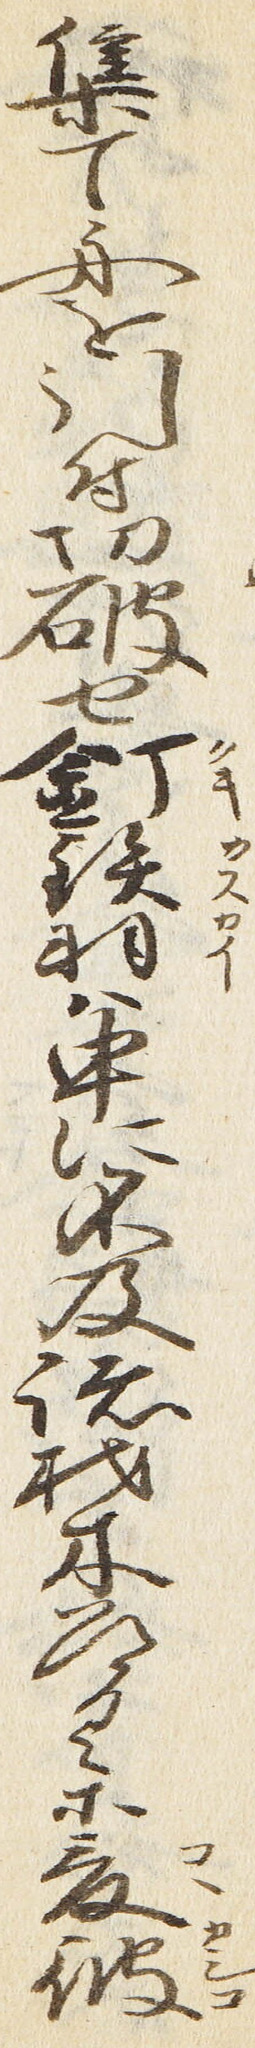集て舟を引付切破せ釘鉄羽は申に不及諸材木道具等爰彼
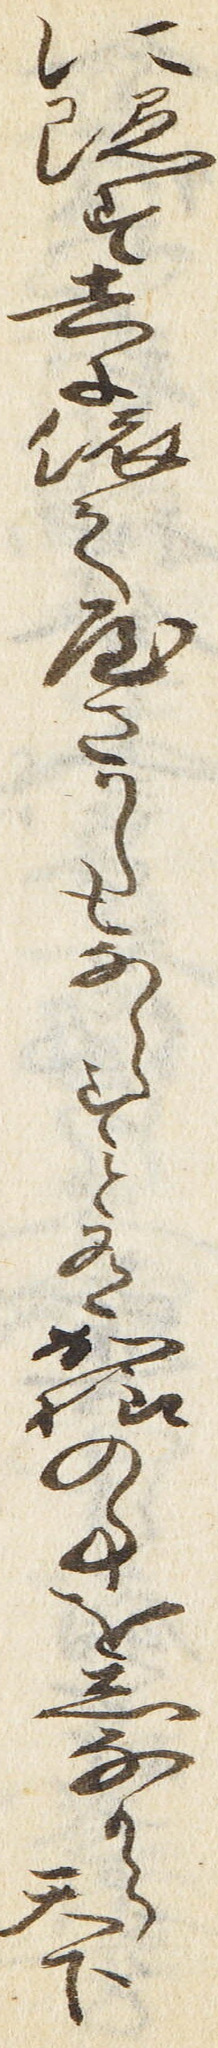に隠す去に依て屋さかしもならすと有か様の事をしなから天下
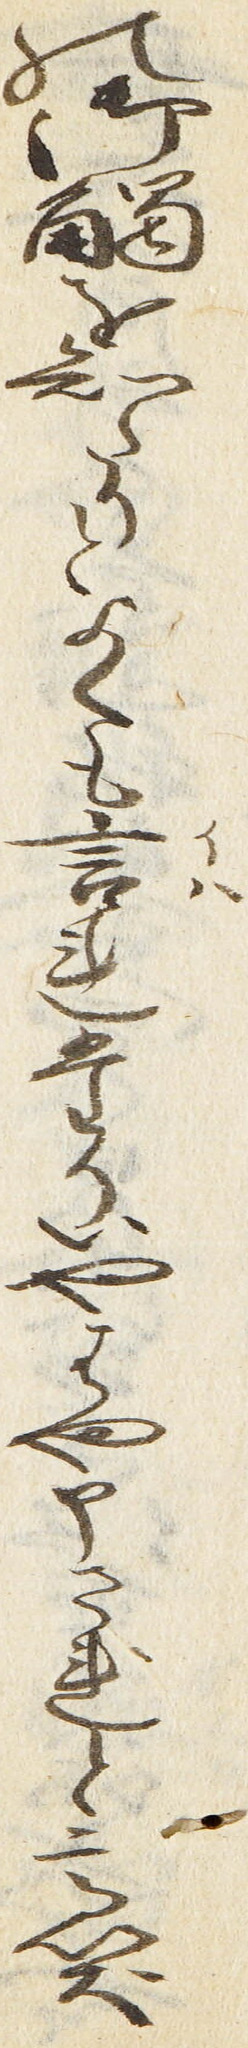の御触を知たりとよくも言れたりいやはや申されと高笑
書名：海陸世話日記
